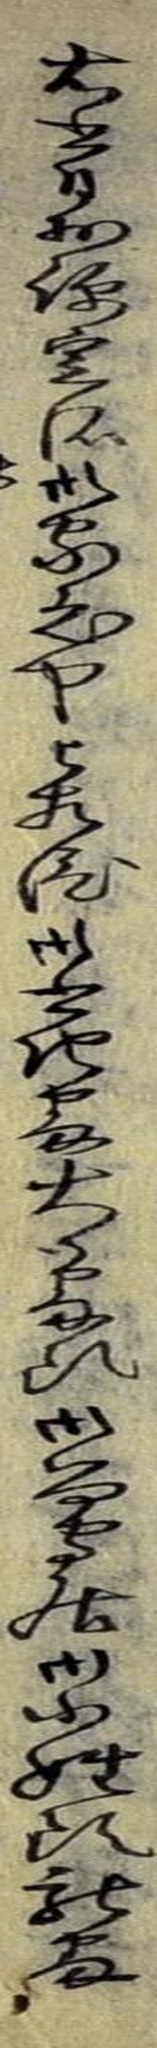右書付於評定所御家老中被相渡御書院番大御番頭御留守居御小姓頭新番
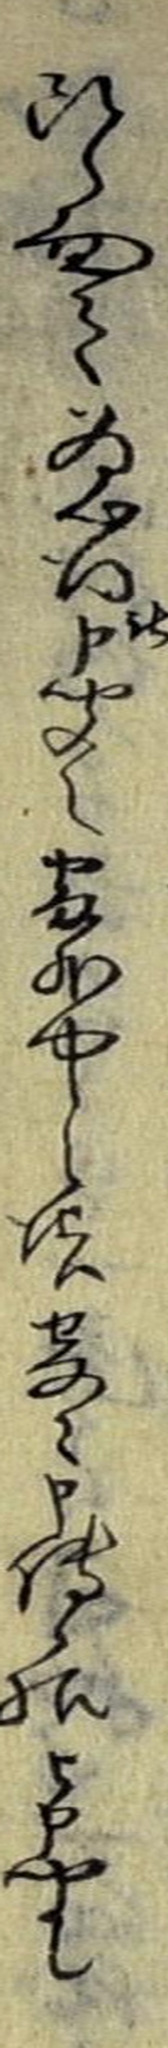頭之面々へ為心得被申聞之番外中之儀ハ寄々申伝候様被申聞候
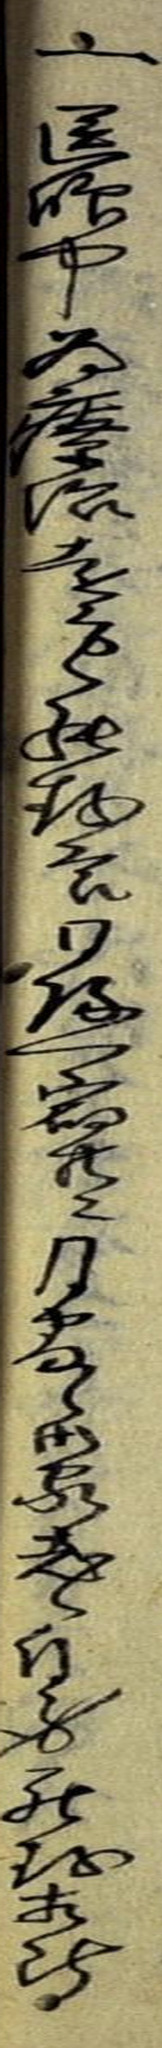一医師中為療治遠方へ罷越節日帰一宿共ニ月番之御家老へ自身罷越相断
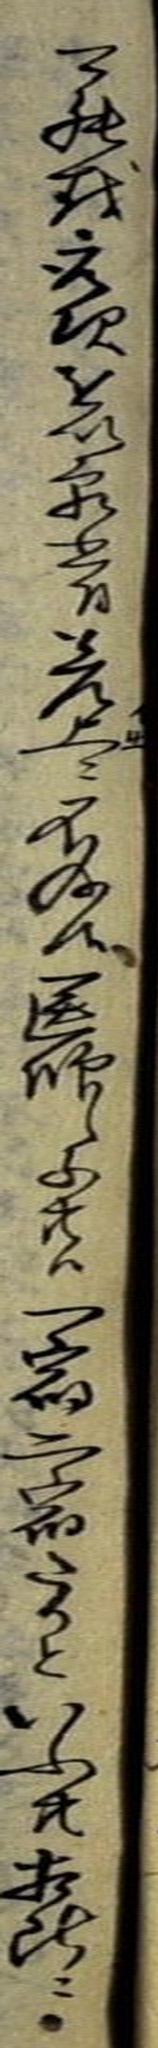可罷越取次を以願書付差上ニ不及候医師之子共ハ一宿二宿たりといふ共相断ニ
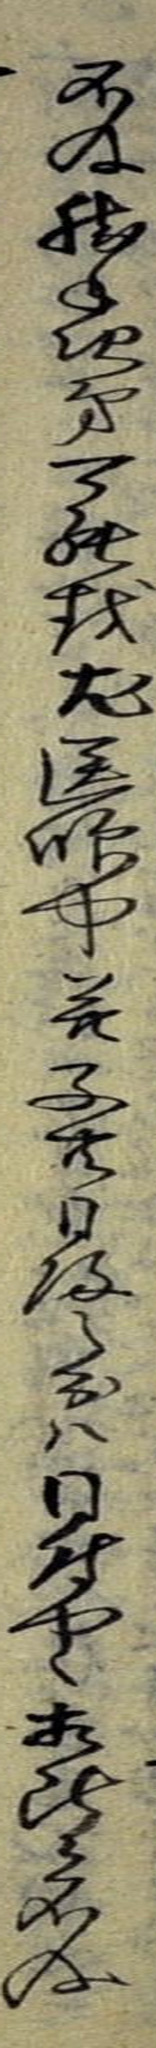不及勝手次第可罷越尤医師中并子共日帰之分ハ目付中へ相断ニ不及
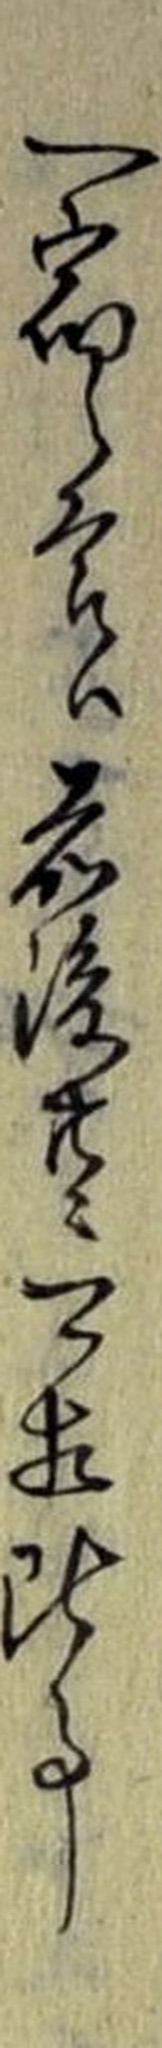一宿之節ハ前後共ニ可相断事
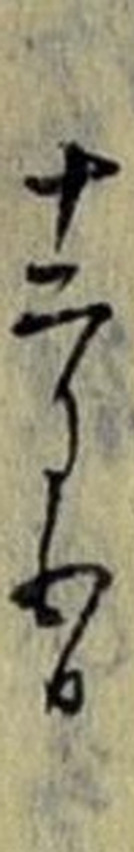十二月五日
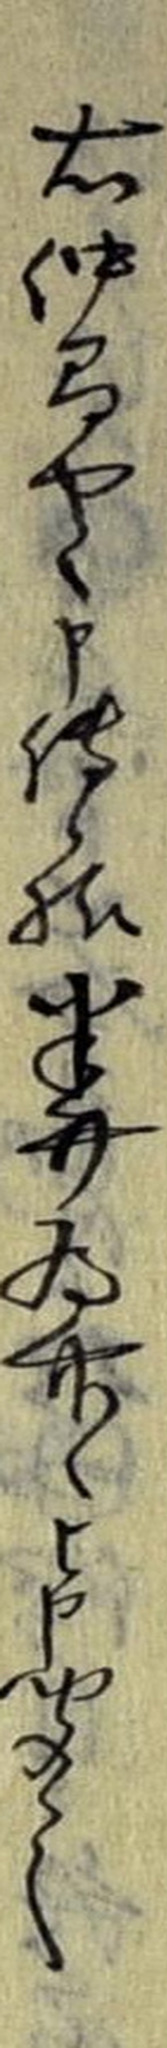右仲間中へ申伝候様半井為竹へ被申聞之
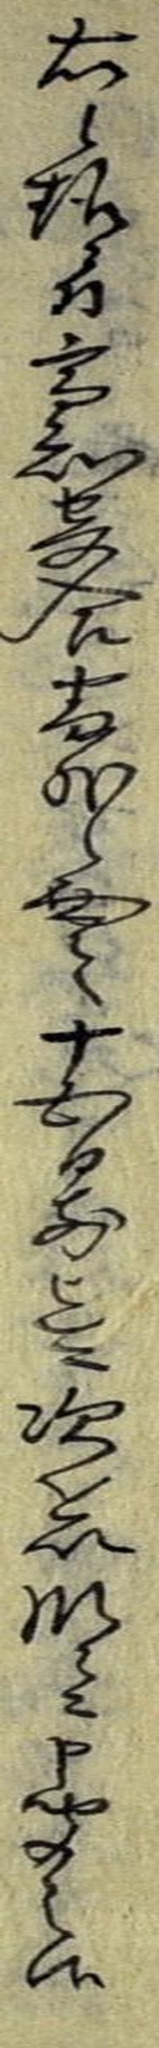右之趣ニ付高知寄合番外之面々十五日前迄ニ次を以段々ニ申聞之候
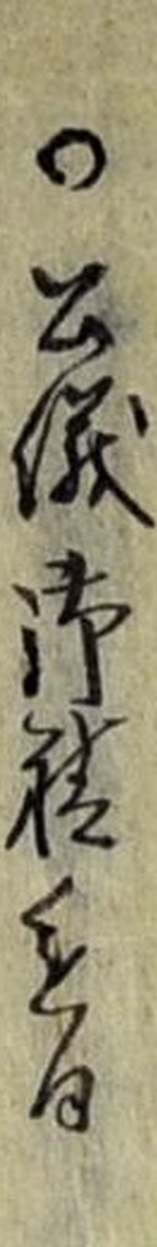〇公儀御精進日
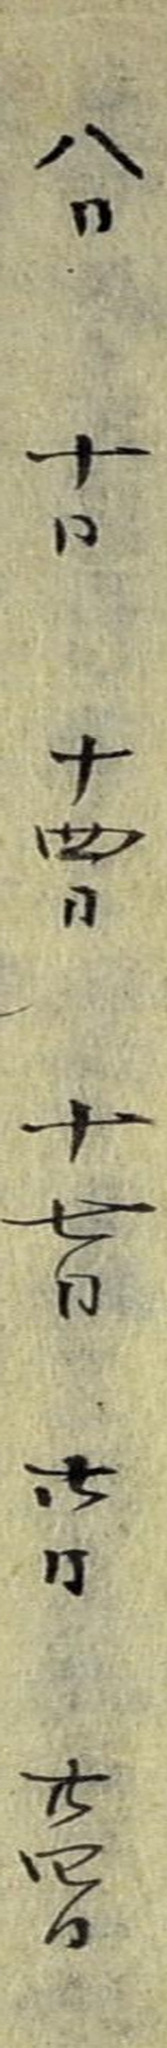八日十日十四日十七日廿日廿四日
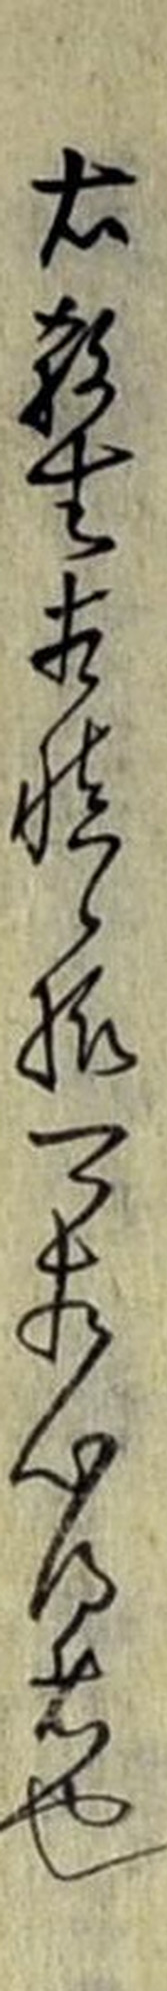右殺生相慎候様可相心得者也
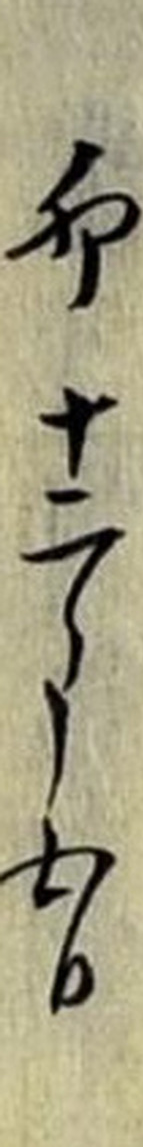卯十二月五日
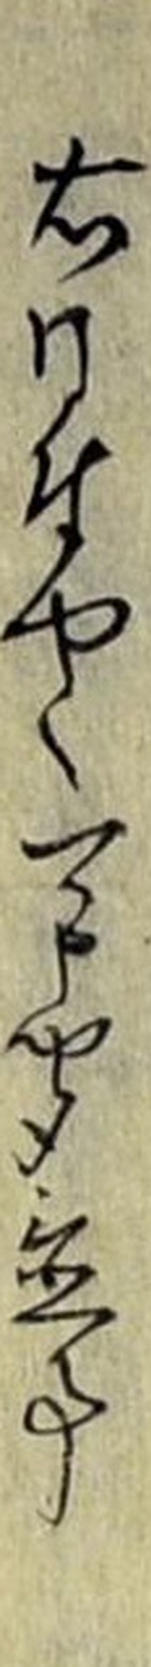右目付中へ可申聞置事
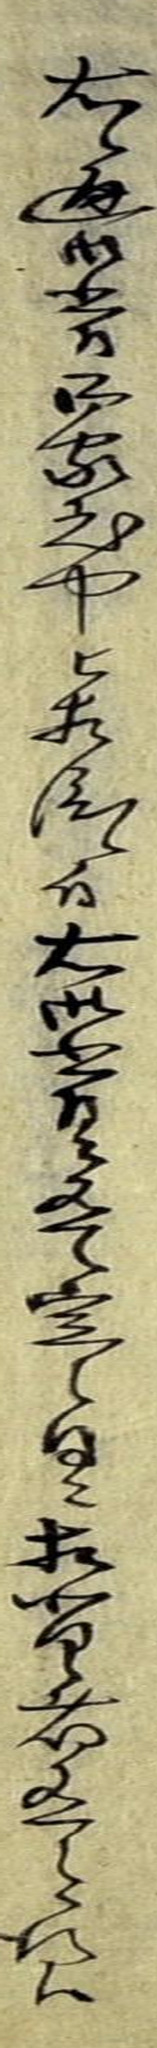右之通御書付御家老中被相渡候ニ付右御書付ニ有之定之日々相背候者有之候得ハ
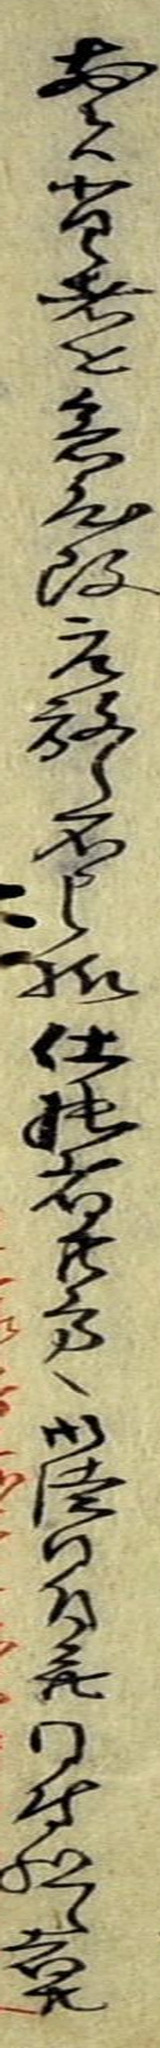前々ハ背候者を急度改取放し不申候様仕能者共方へ御徒目付并目付組之者共
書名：命令之部 一
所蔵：福井県文書館 Fukui Prefectural Archives
